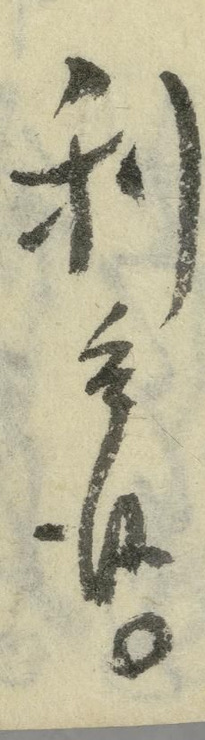弥兵衛
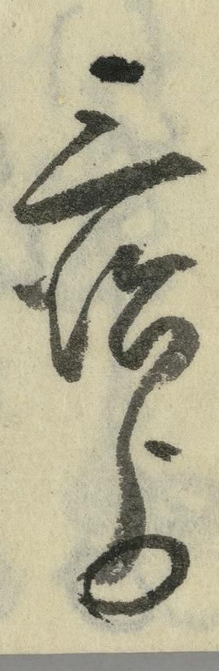嘉兵衛

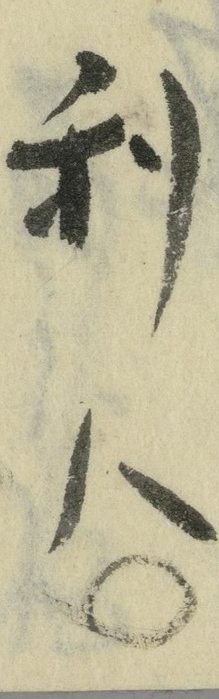利八〇
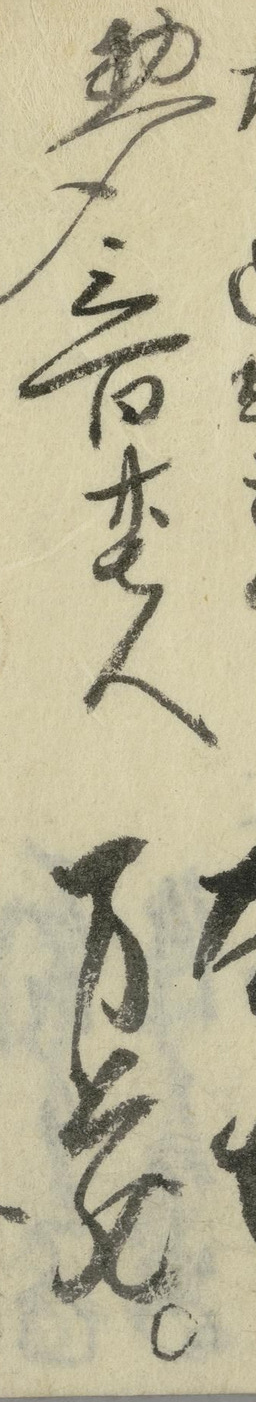惣〆三百廿七人万蔵〇

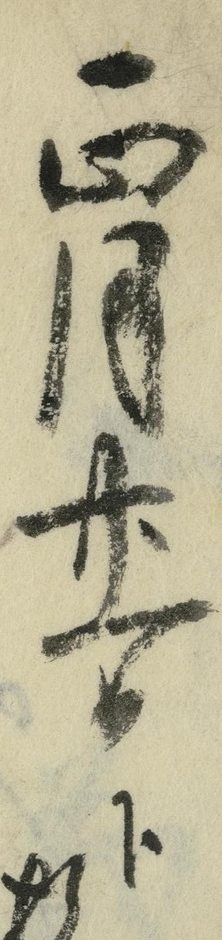正月廿一日
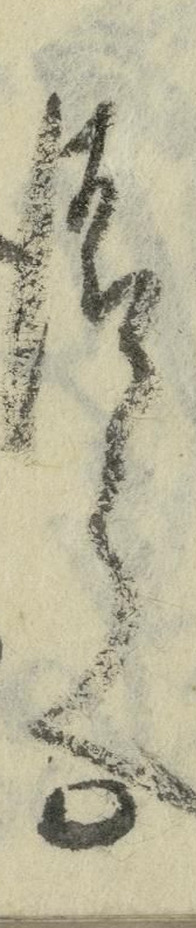伊兵衛
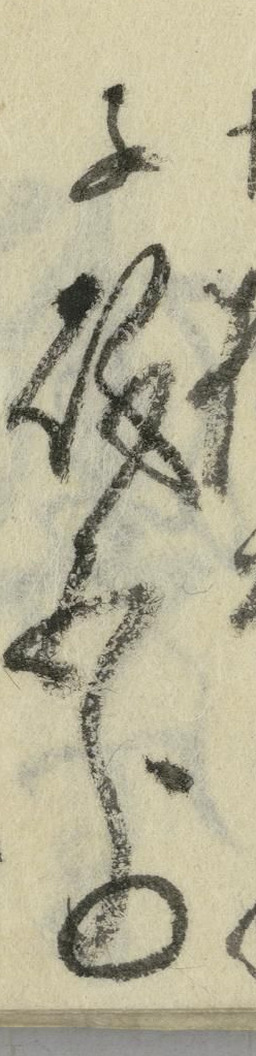子磯五郎
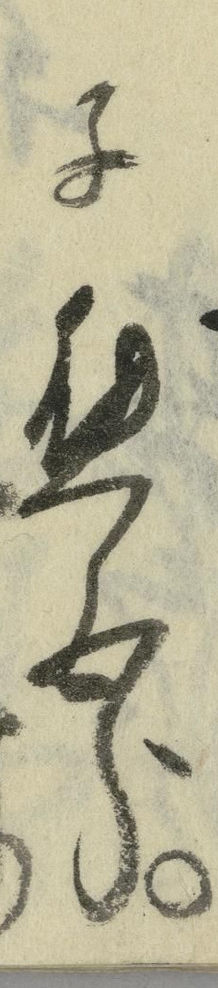子磯五郎
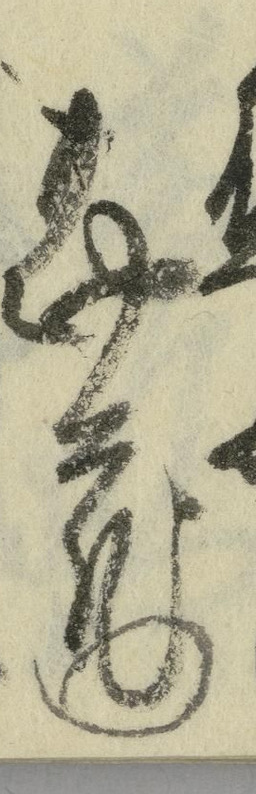嘉兵衛
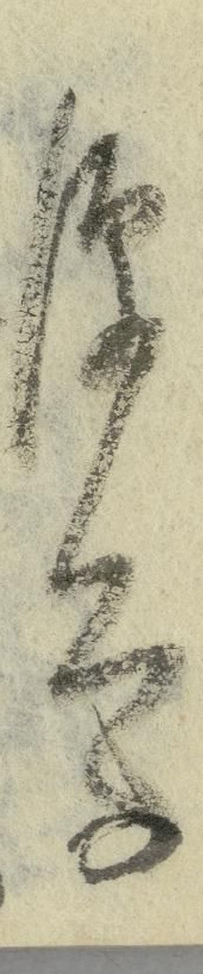源兵衛
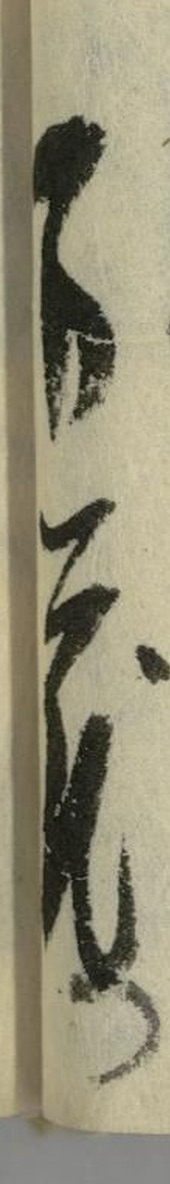源兵衛
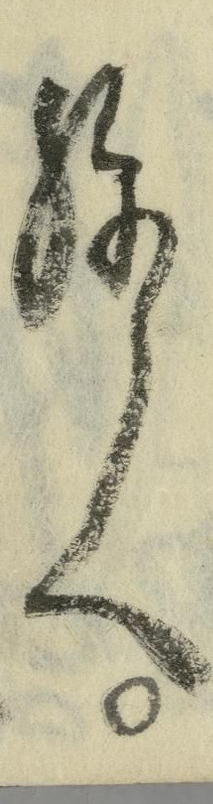伊兵衛
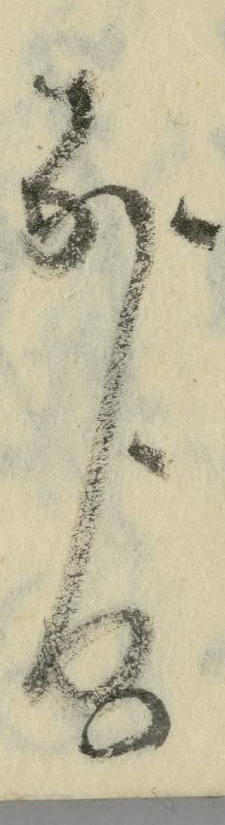嘉兵衛

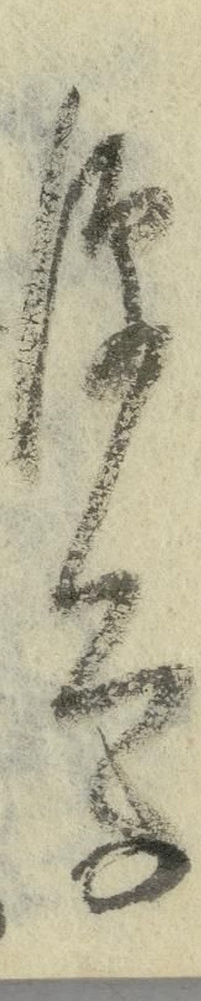孫兵衛
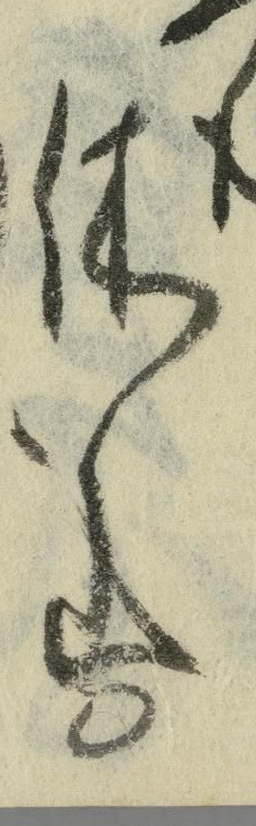孫兵衛
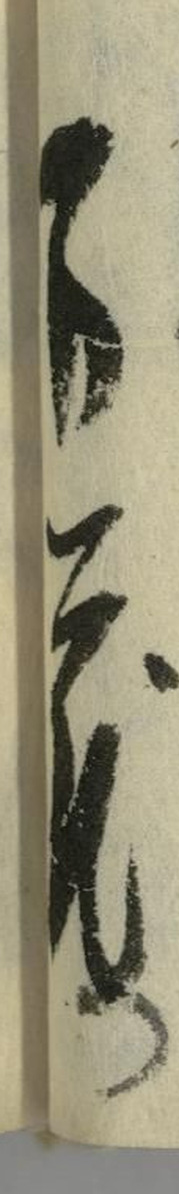孫兵衛
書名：天明淺間噴火ニ関スル書類
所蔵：東京大学地震研究所図書室 Earthquake Research Institute Library, The University of Tokyo, JAPAN
